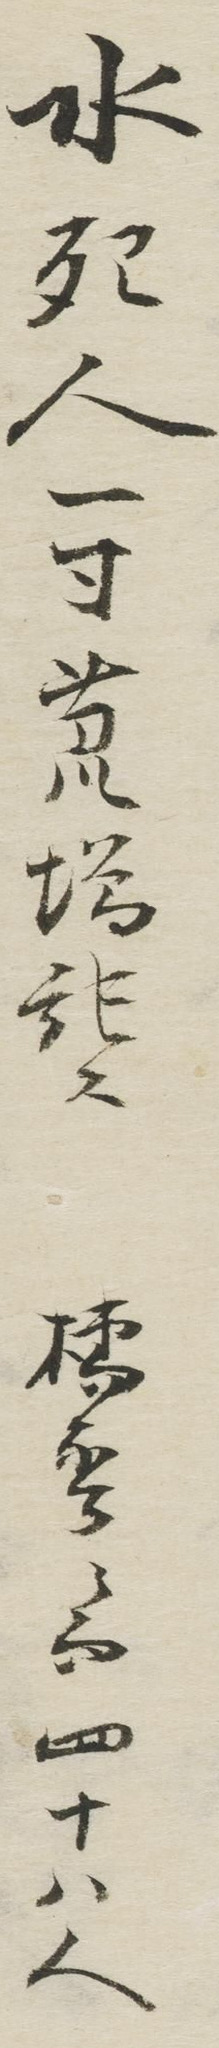水死人一寸荒増記ス橋なとニ而四十八人

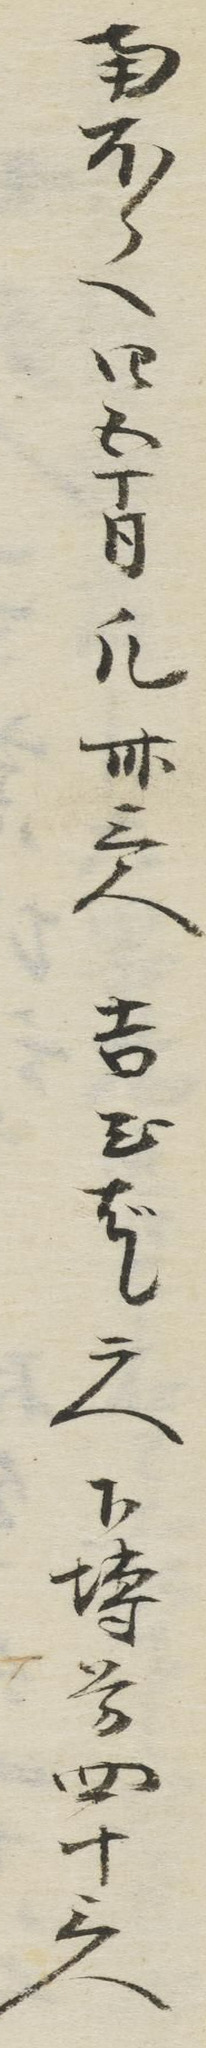南ほりへ四五丁目凡丗三人吉屋ばし二人下博労四十三人
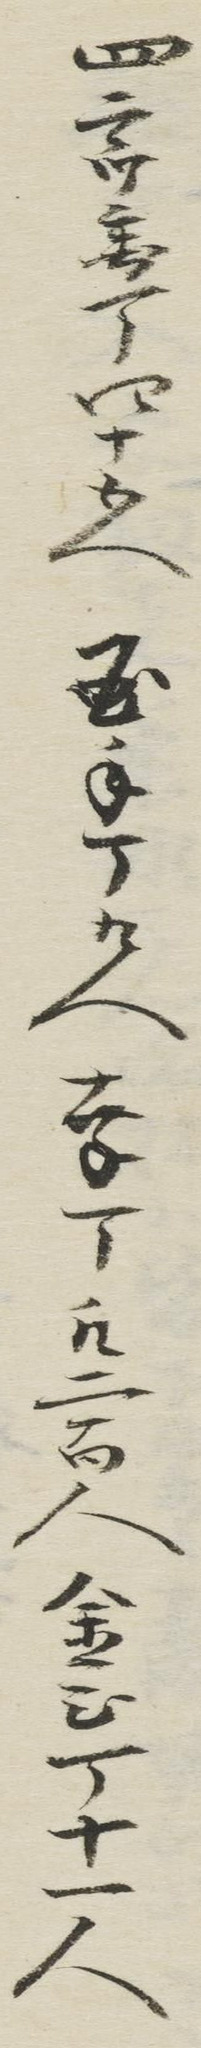四郎番丁四十五人玉手丁九人幸丁凡二百人金屋丁十一人
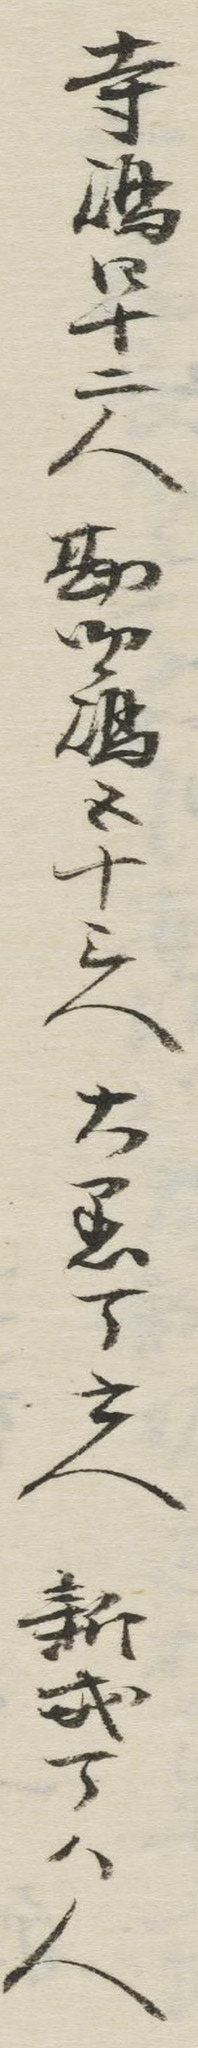寺嶋四十二人勘助嶋五十三人大黒丁六人新戎丁八人
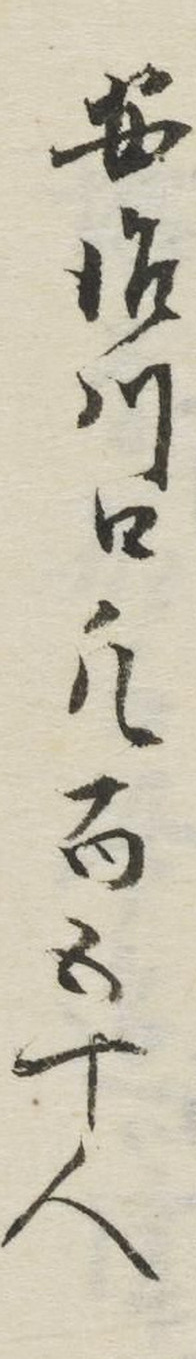安治川口凡百五十人
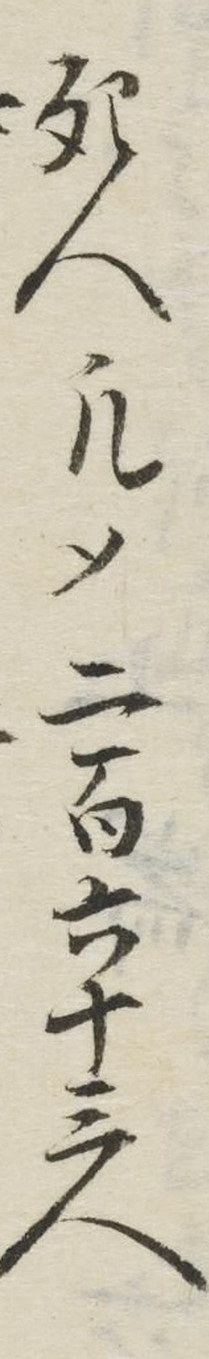死人凡〆二百六十三人
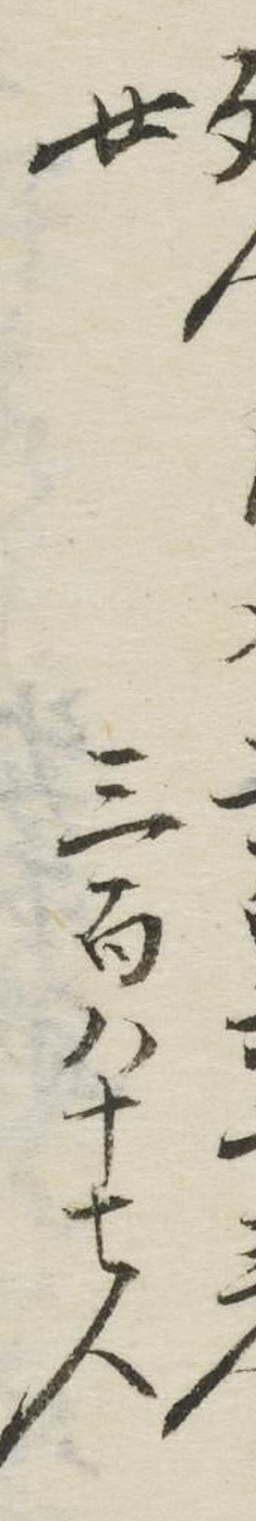女三百八十七人
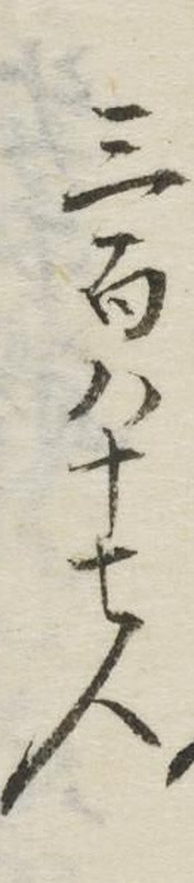女三百八十七人
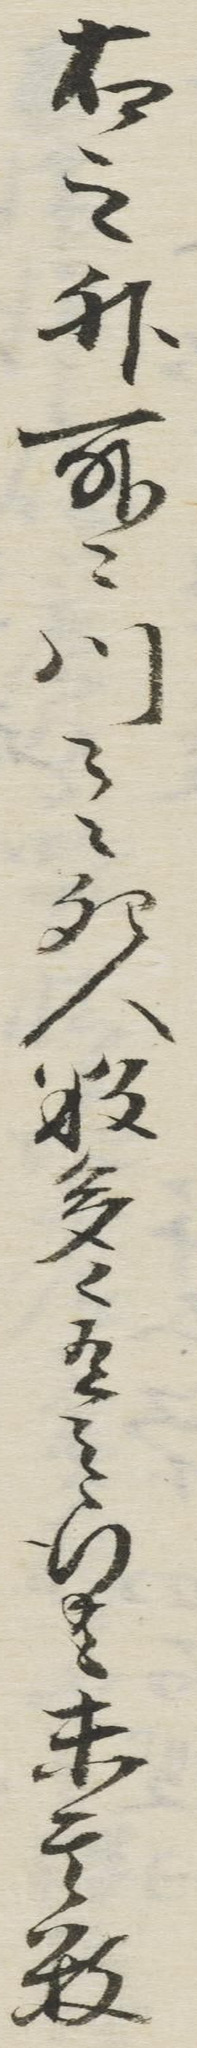右之外所々川々之死人数多く有之候得共未其数
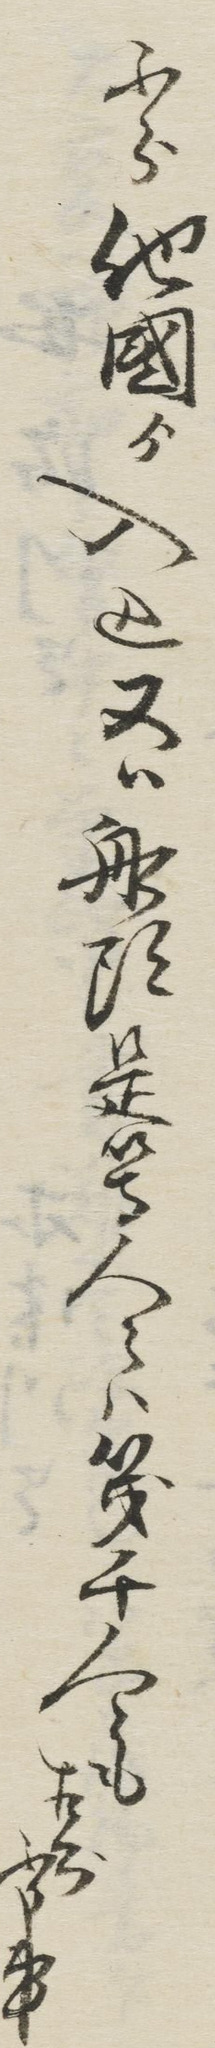不分他国ゟ入込又ハ船頭是等人々ハ幾千人とも相分不申事
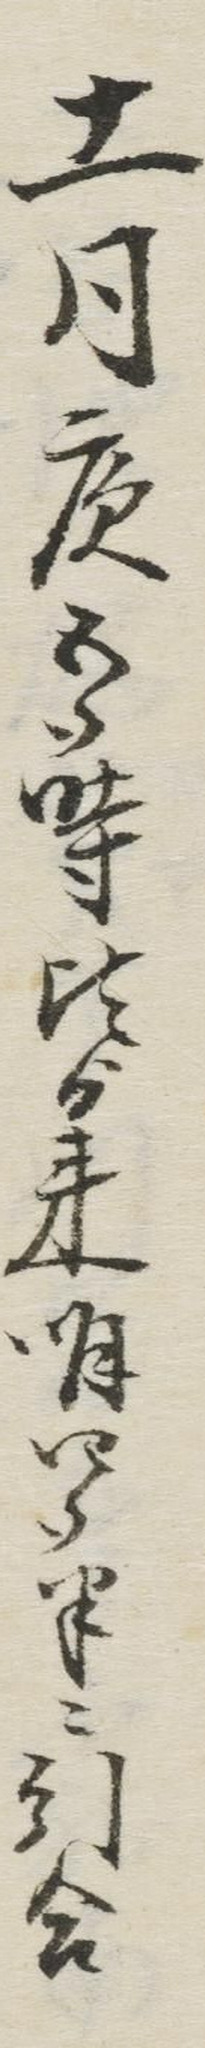十一月夜五ッ時頃ゟ来明四ッ半二引合
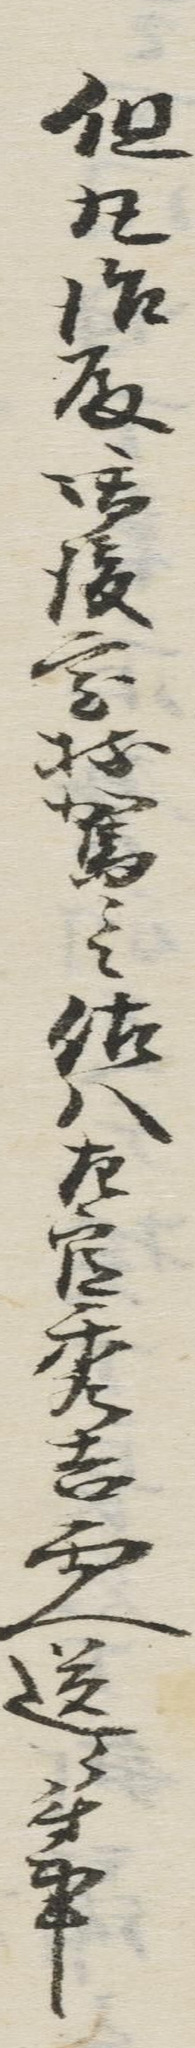但丸治殿ヘ御後室様駕ニて佐八左官秀吉両人送ニ付事
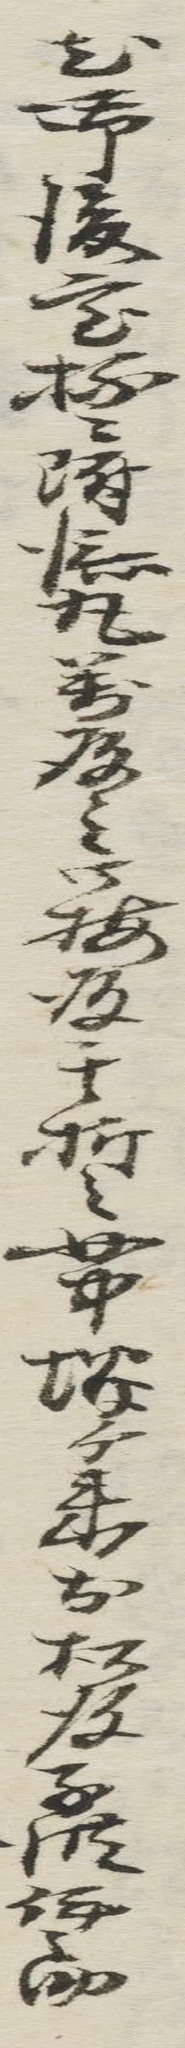尤御後室様ニ付添丸萬多之御梅多其折之女中堺ゟ来お松役子供伊之助
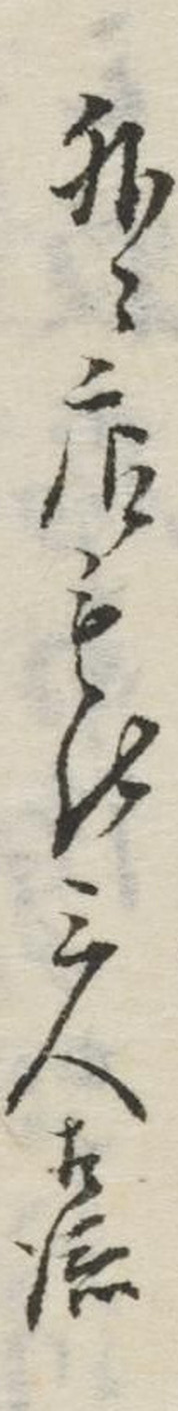外二店もの三人相添
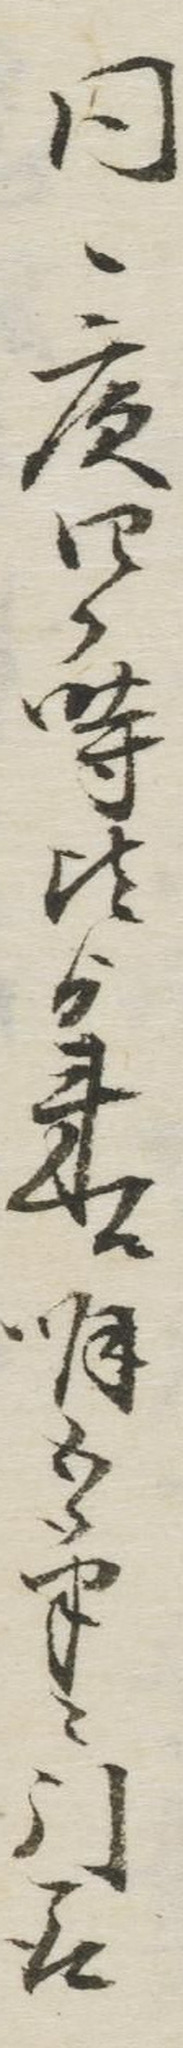同日夜四ッ時頃ゟ来ス明五つ半二引取
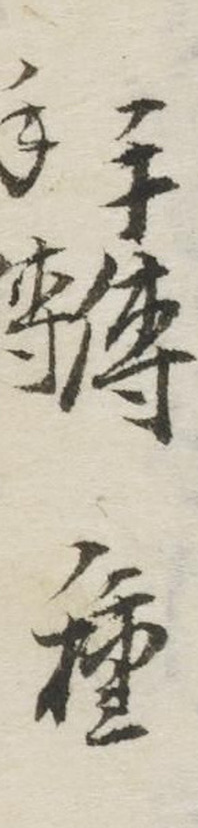手伝種
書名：諸国大地震大津波一代記
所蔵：東京大学地震研究所図書室 Earthquake Research Institute Library, The University of Tokyo, JAPAN
